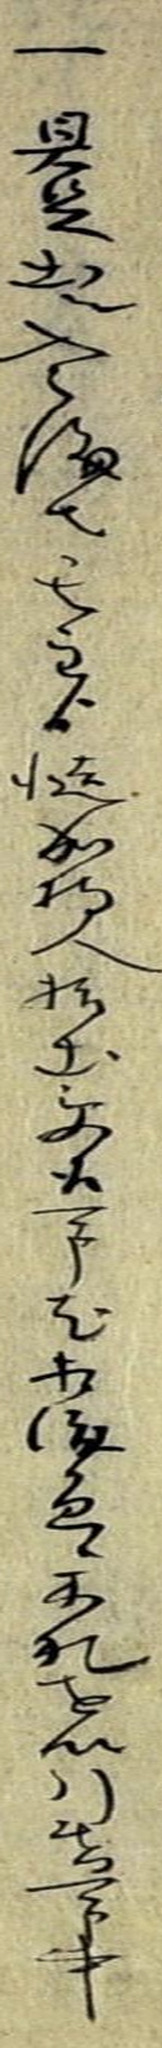一具足出し入之儀は其主ゟ慥成持人指出受取可申尤相渡置候木札を以引替可申事
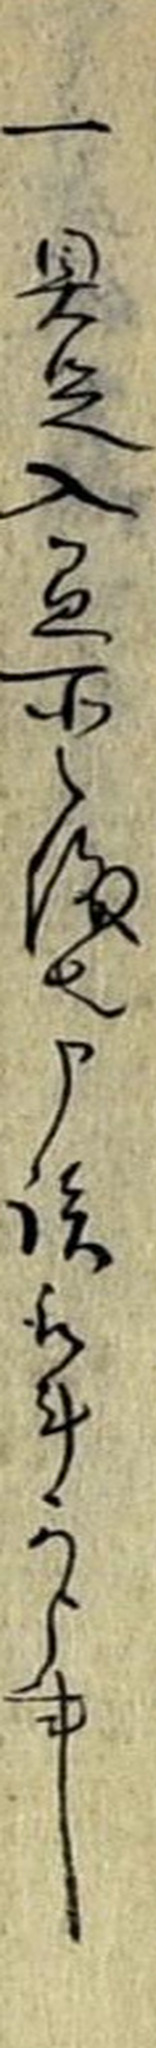一具足入置所之儀ハ申談取斗可申事
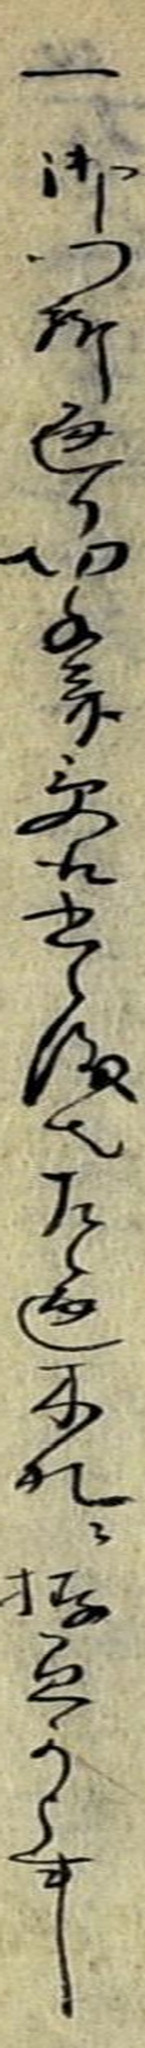一御門所通り切手并受取書之儀ハ左之通木札に拵置可申事
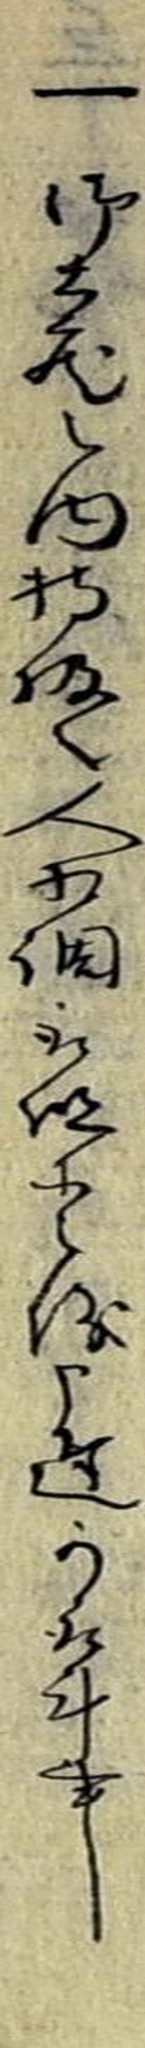一御土蔵之内持扱之人相調取組等之儀申達可取斗事
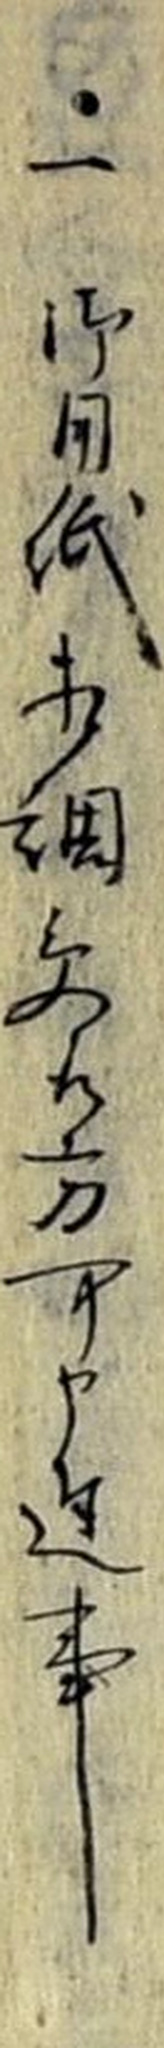一御用紙相調受取方可申達事
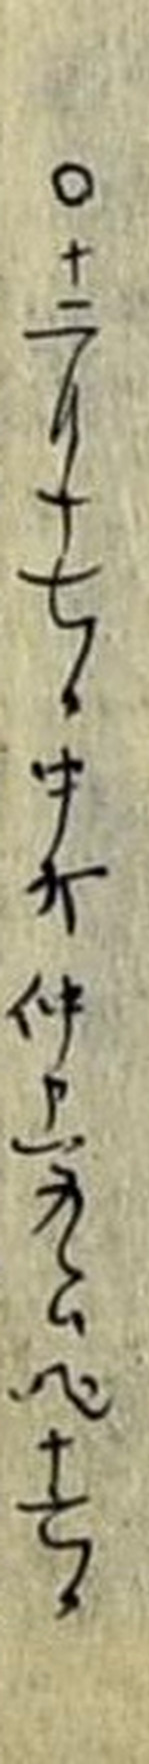○十二月十七日中村仲申聞候は昨十六日
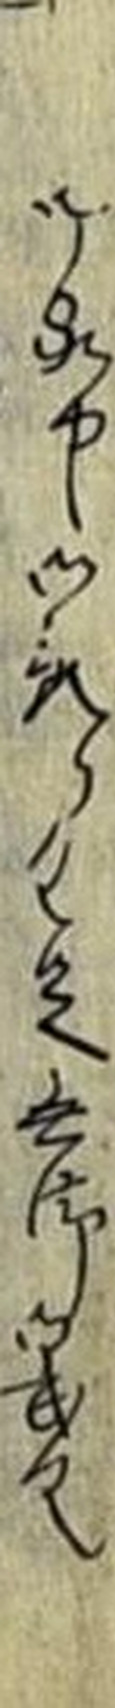御家中御預り之具足無滞御武具
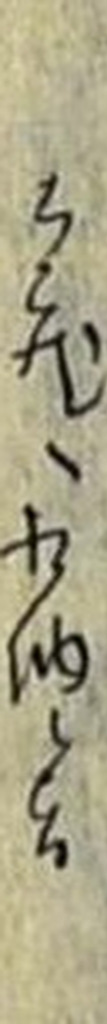土蔵へ相納候旨
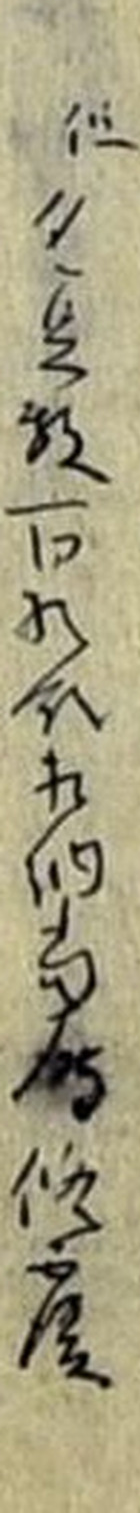但具足数百拾領相納当時修覆
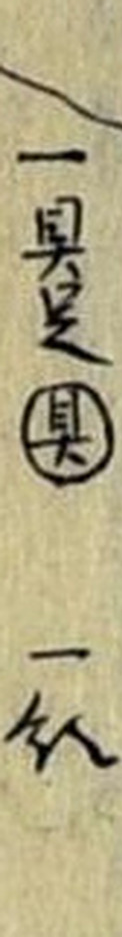一具足一領
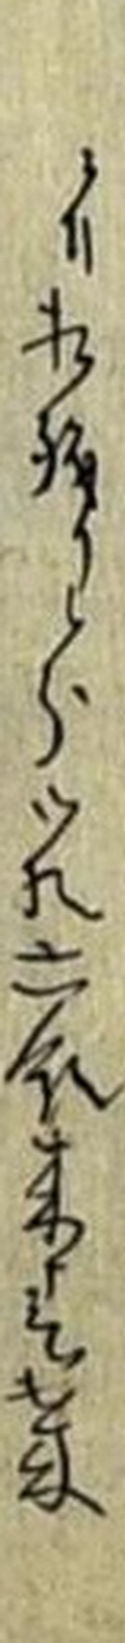に付相残り候分弐拾六領来未年出来
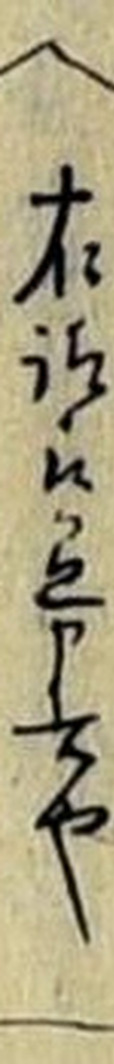右御請取置申者也
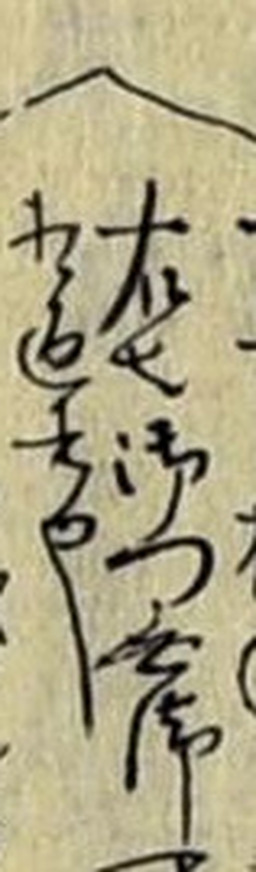相通者也
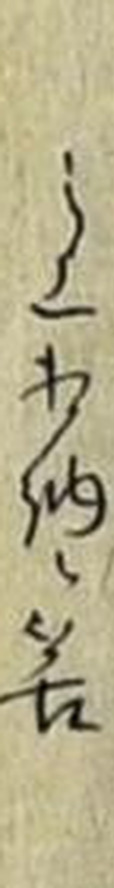之上相納候筈
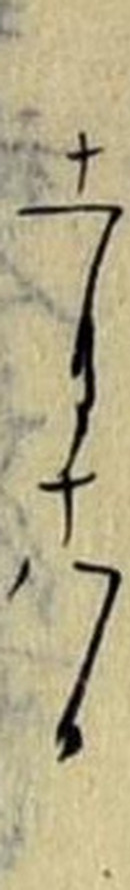十一月十八日
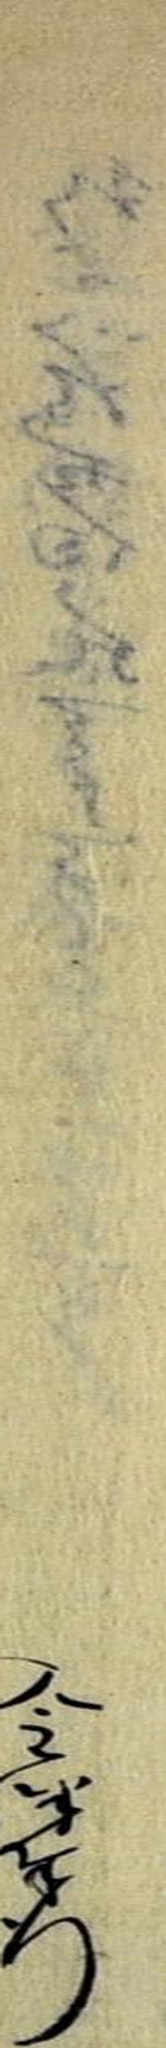金津奉行
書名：命令之部 四
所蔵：福井県文書館 Fukui Prefectural Archives
